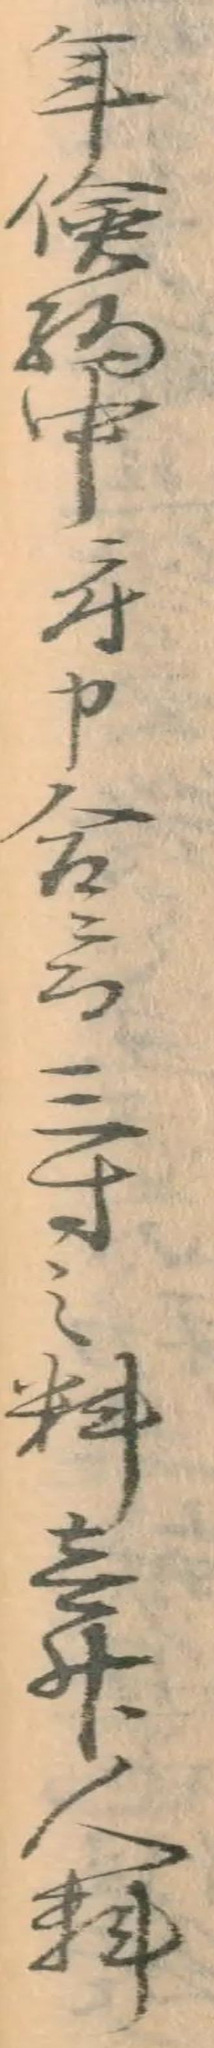年倹約中ニ付申合ニ而三寸之料壱升人料
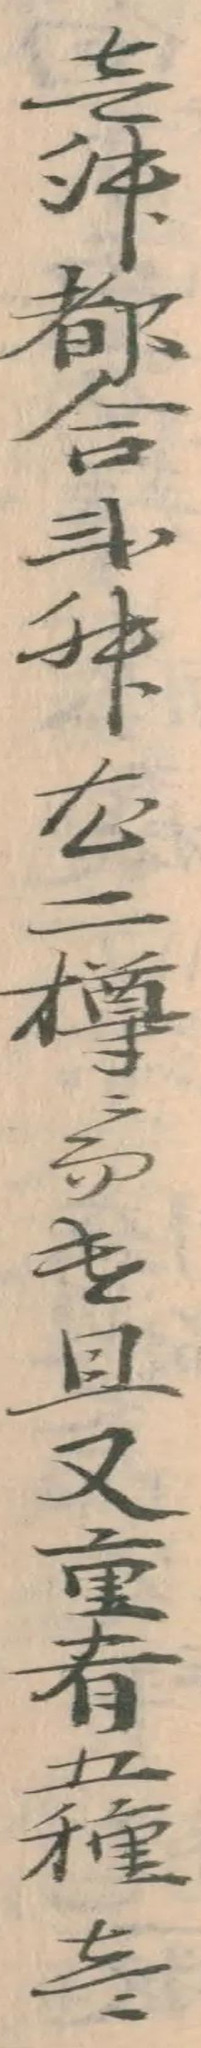壱升都合弐升尤二樽ニ而遣且又重肴五種壱
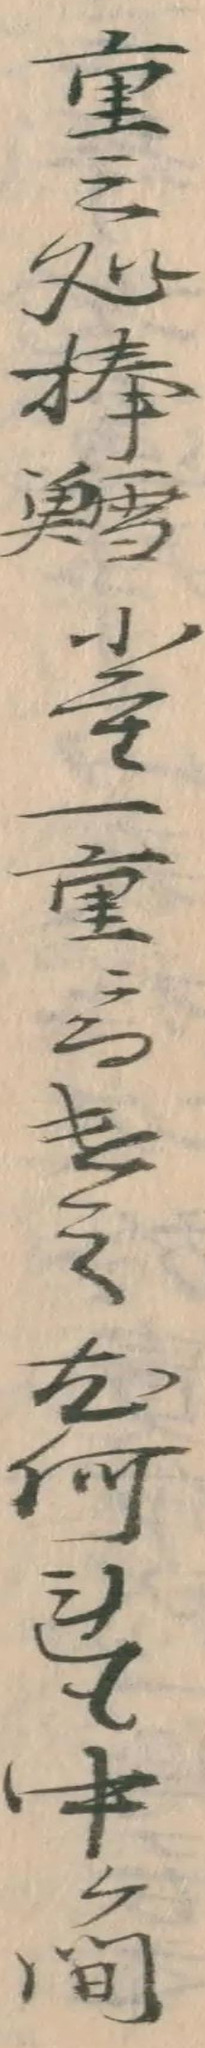重之処棒鱈小重一重ニ而遣之尤何れも中ケ間
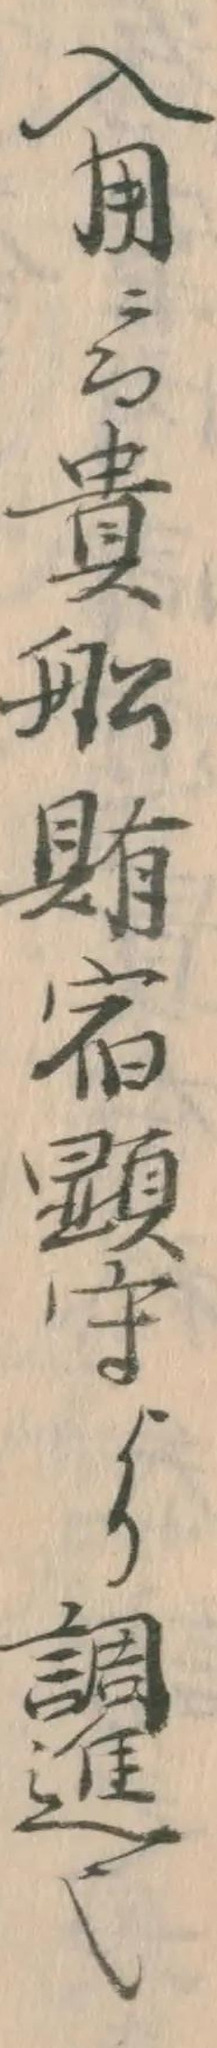入用ニ而貴舩賄宿顕守より調進也
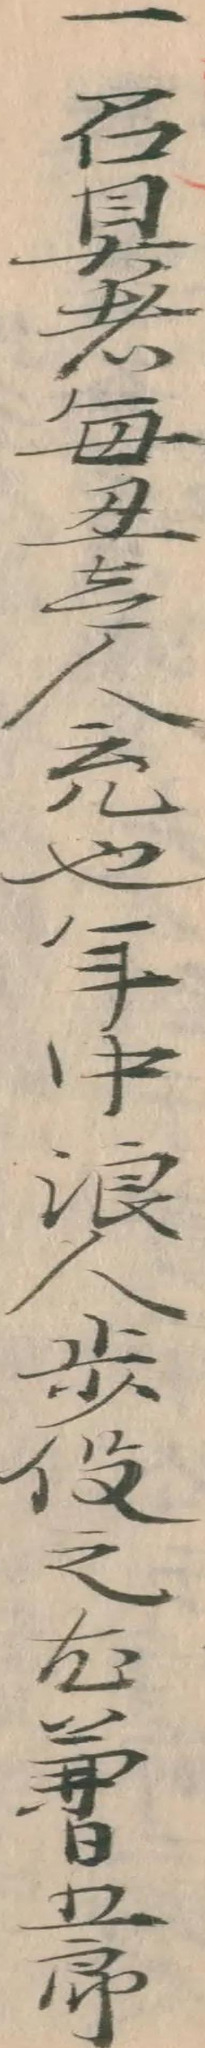一召具者毎丑壱人充也年中浪人歩役之尤兼日五郎
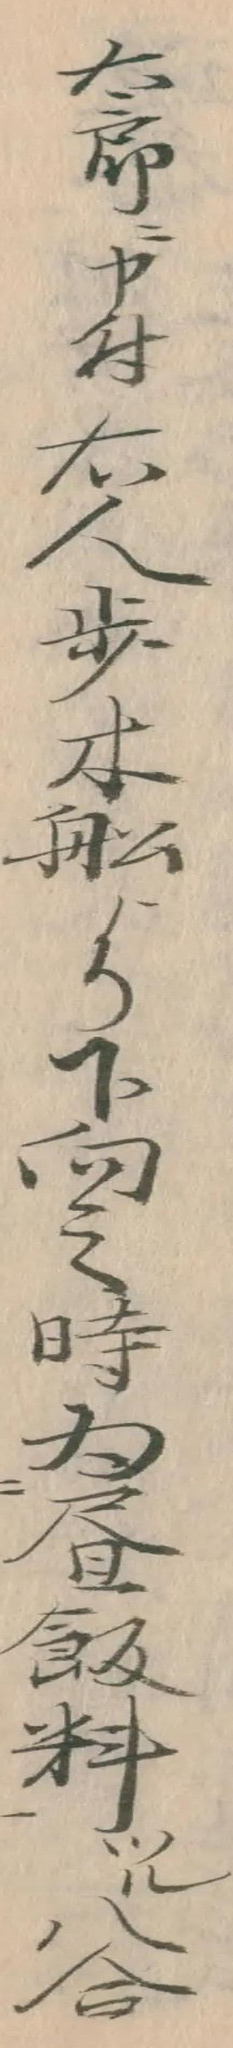太郎ニ申付右人歩木舩より下向之時為昼飯料ツル八合
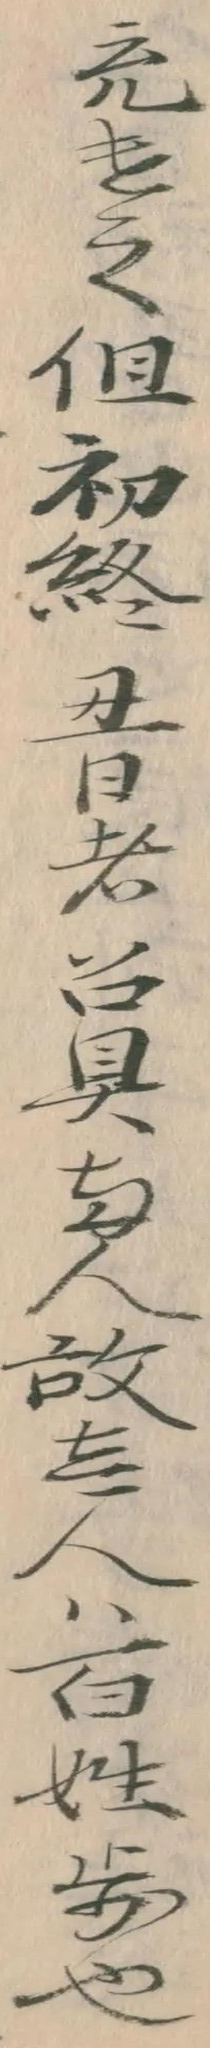充遣之但初終丑日者召具両人故壱人ハ百姓歩也
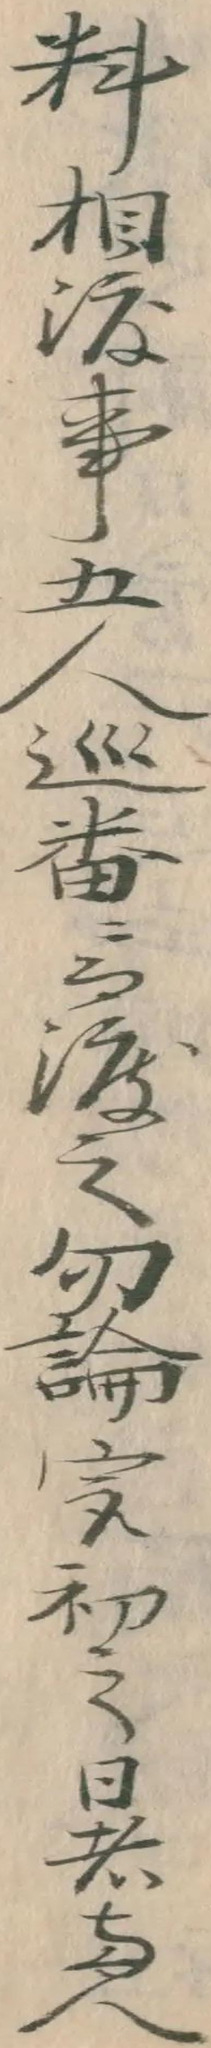料相渡事五人巡番ニ而渡之勿論最初之日者両人
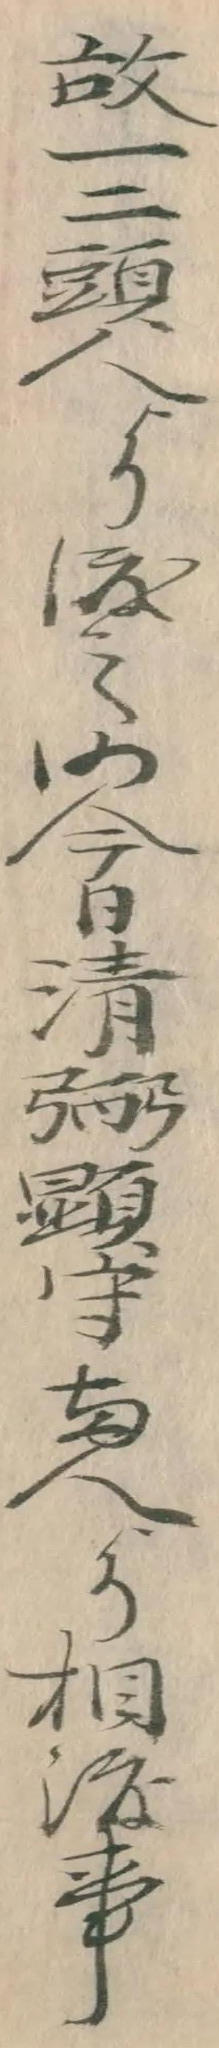故一二頭人より渡之仍今日清弼顕守両人より相渡事
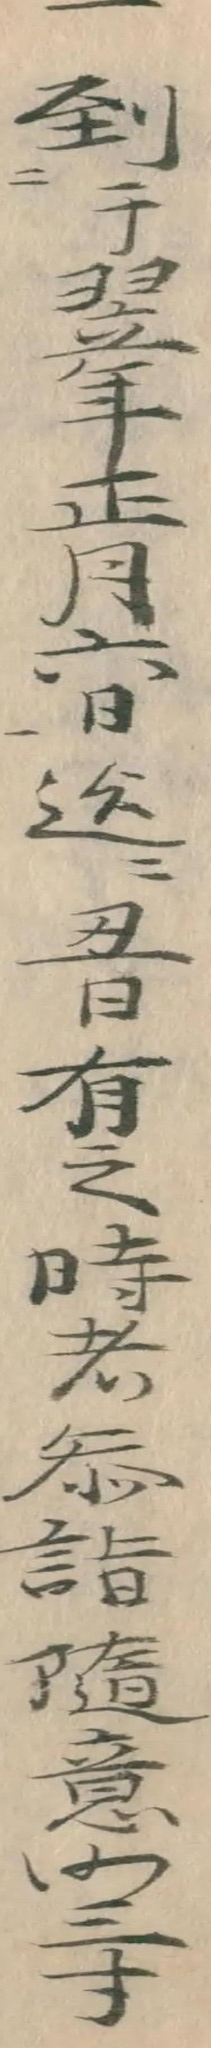一到于翌年正月六日迄ニ丑日有之時者参詣随意仍三寸

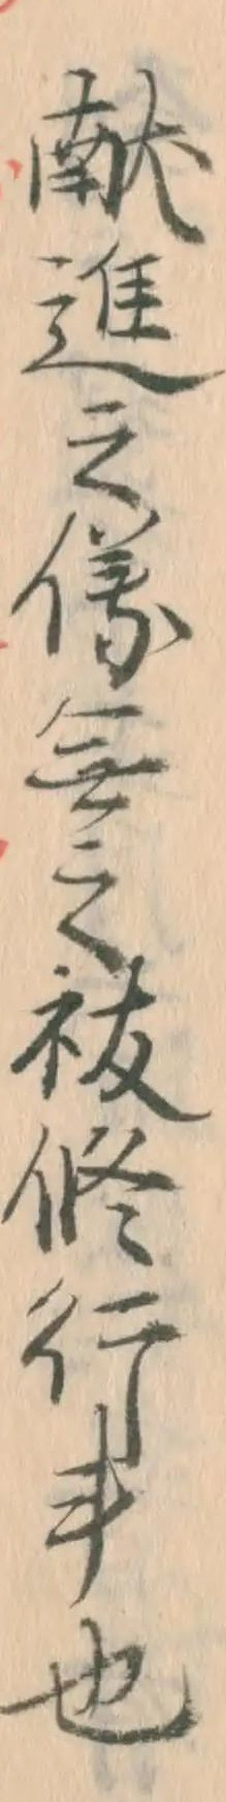献進之儀無之祓修行斗也
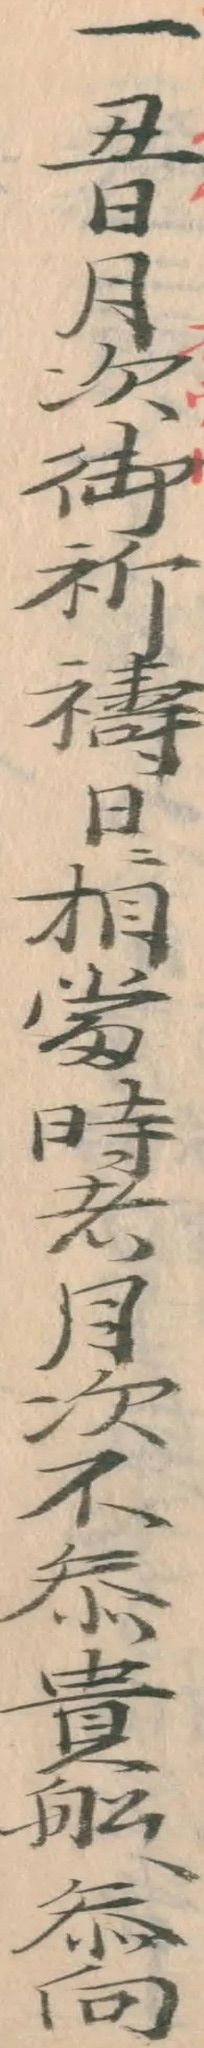一丑日月次御祈祷日ニ相當時者月次不参貴舩ヘ参向
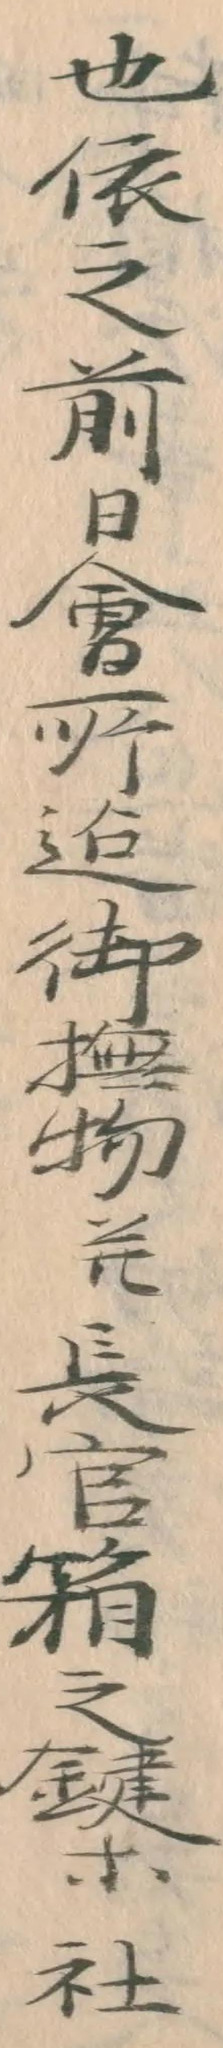也依之前日會所迄御撫物并長官箱之鍵等社
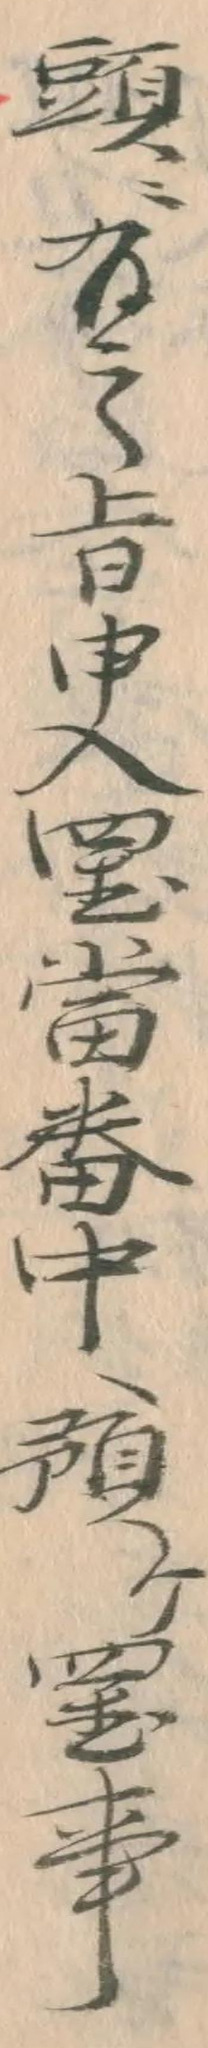頭ニ有之旨申入置當番中へ預ケ置事
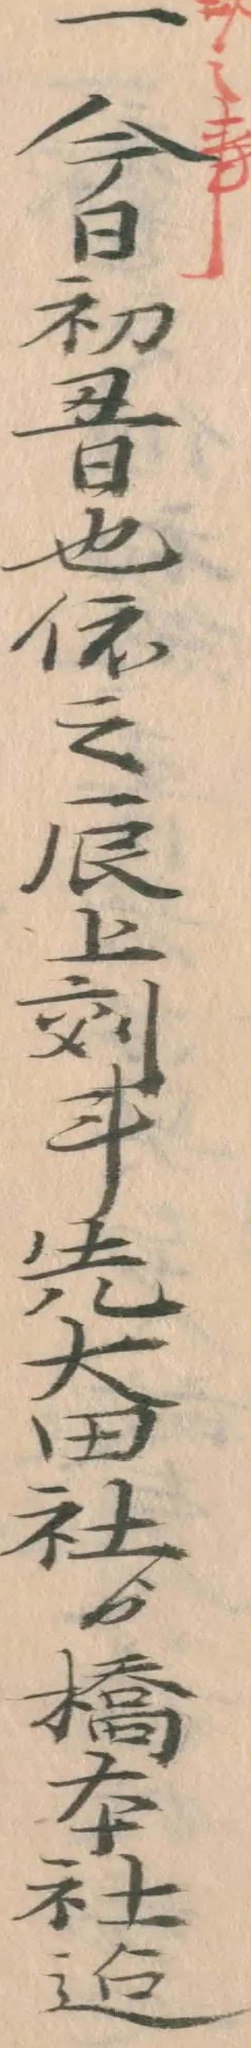一今日初丑日也依之辰上刻斗先大田社ゟ橋本社迄
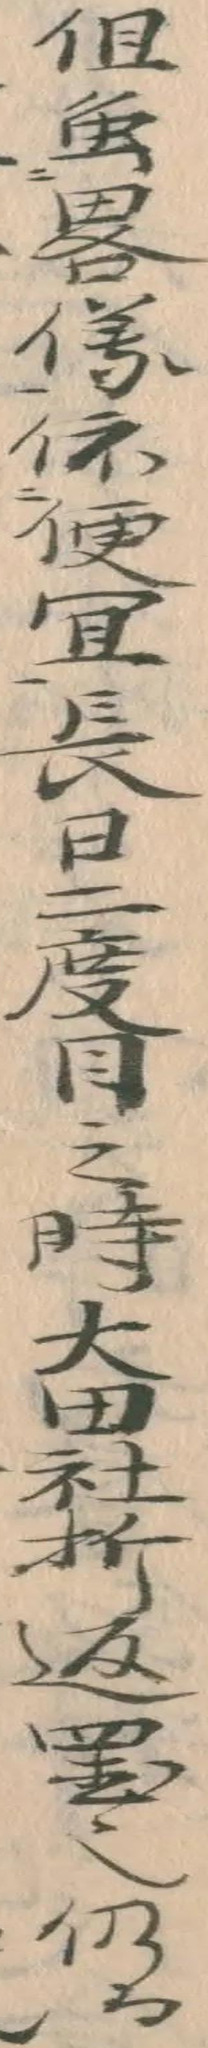逆参但虫畧儀依便宜長日二度目之時大田社折返置也仍而
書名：賀茂社記録. 第72冊
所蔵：国立国会図書館 National Diet Library, JAPAN
